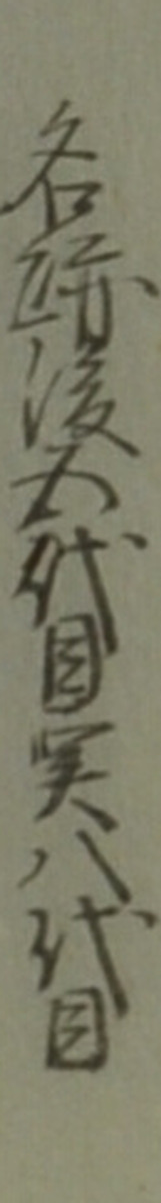名跡後五代目実八代目
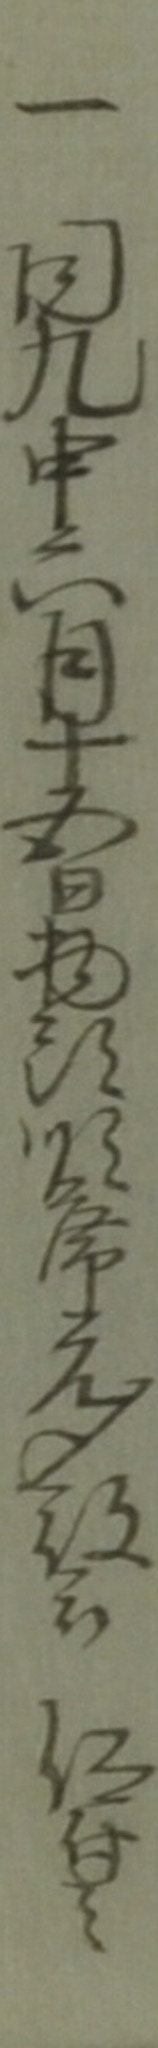一同九申六月十五日物頭順席元〆役被仰付之
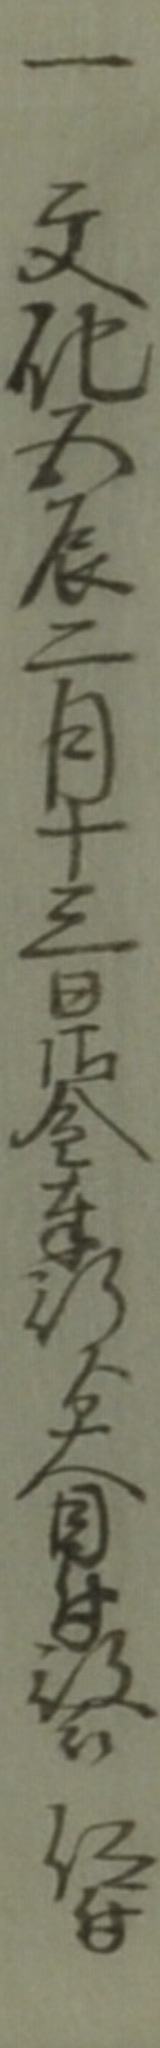一文化五辰二月十三日御金奉行ゟ大目付役被仰付
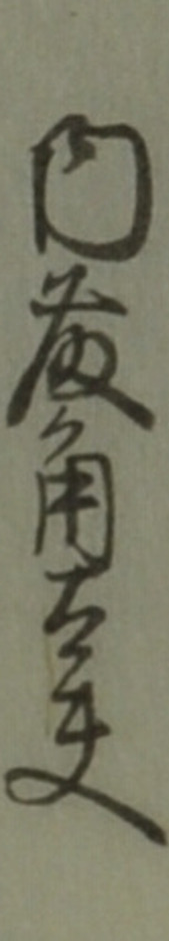内藤角太夫
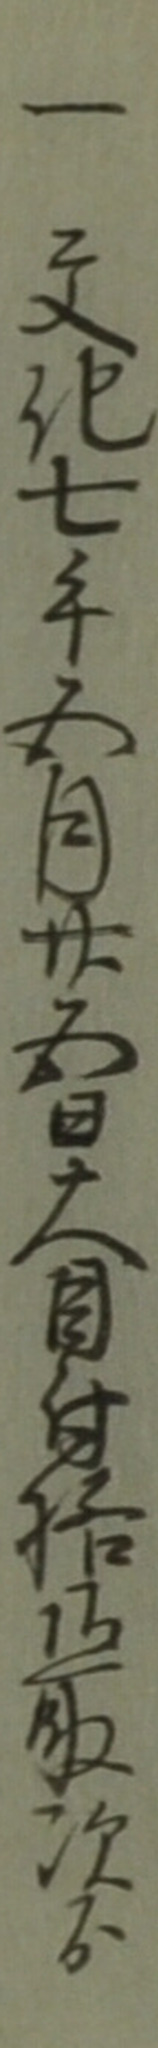一文化七午五月廿五日大目付格御取次ゟ
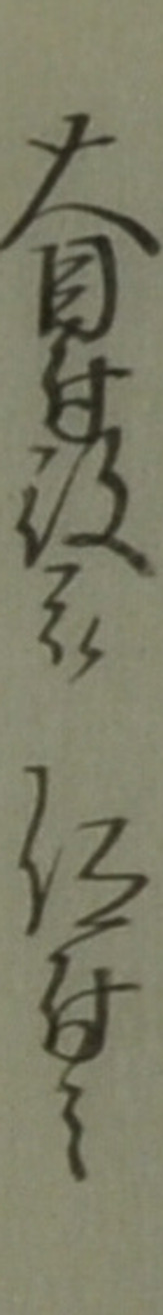大目付役被仰付之
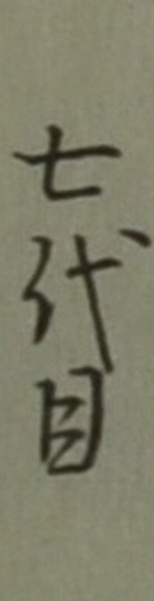七代目
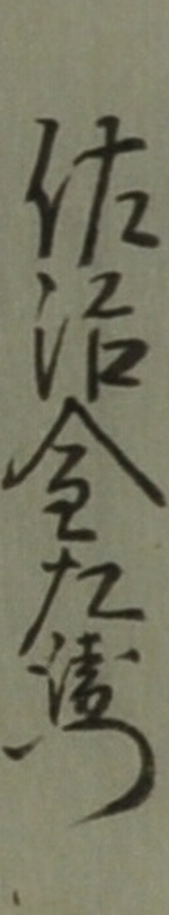佐治金左衛門
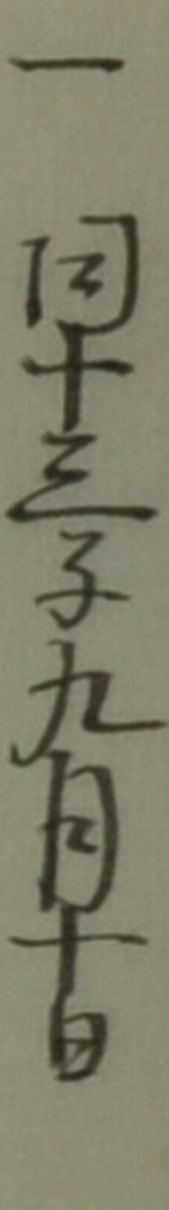一同十三子九月十日
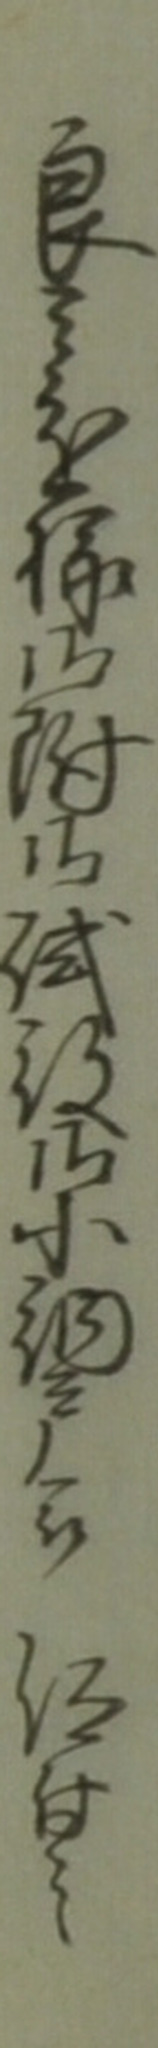良之進様御附御試役御小納戸被仰付之

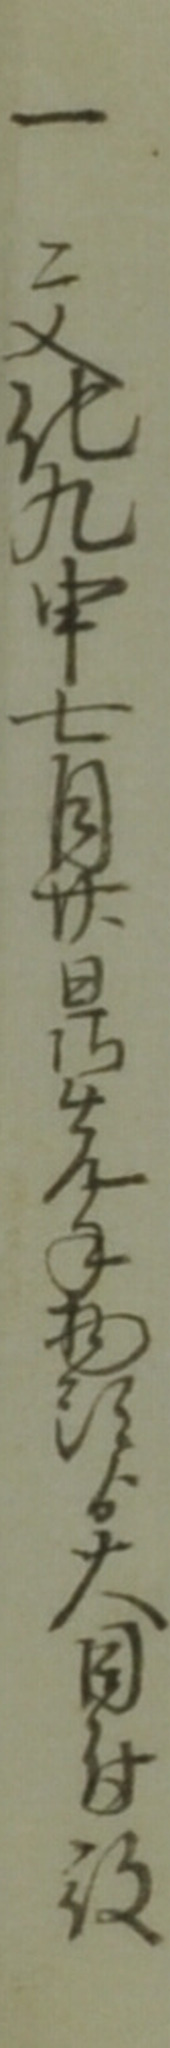一文化九申七月廿日御先手物頭ゟ大目付役
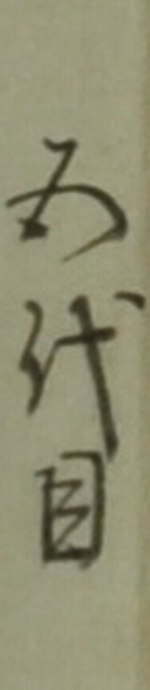五代目
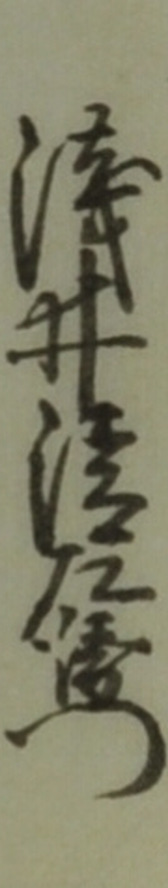浅井清左衛門
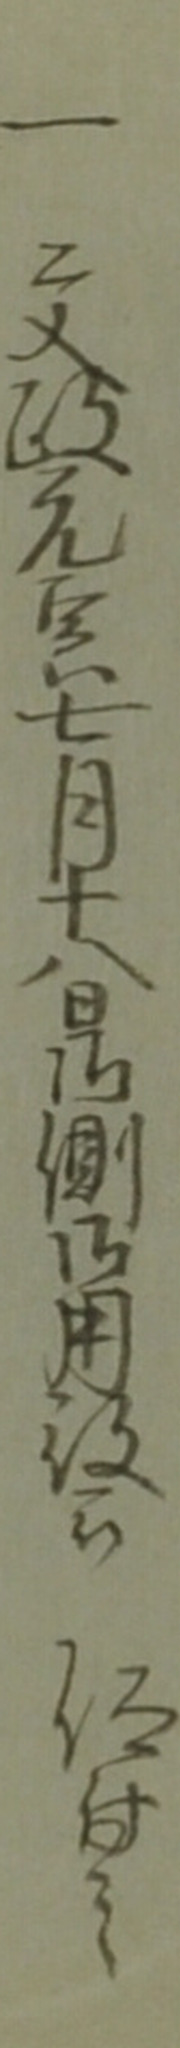一文政元寅七月十八日御側御用役被仰付之
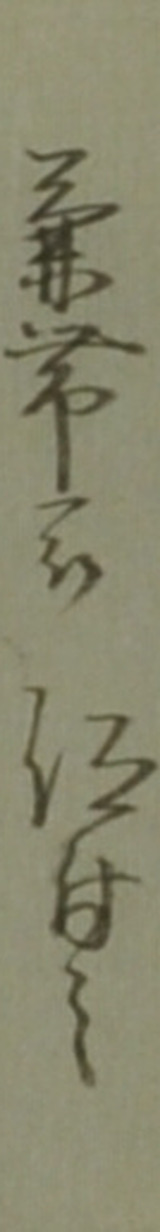兼帯被仰付之
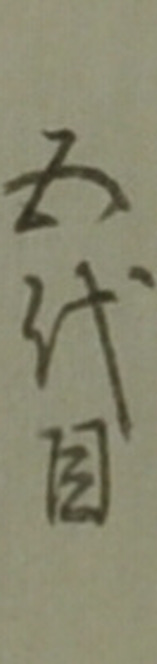五代目
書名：諸御役代々録（三）
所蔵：伊那市立高遠町図書館・合同会社AMANE
